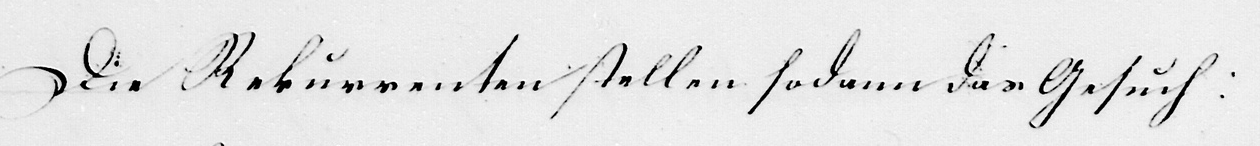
Die Rekurrenten stellen sodann das Gesuch:
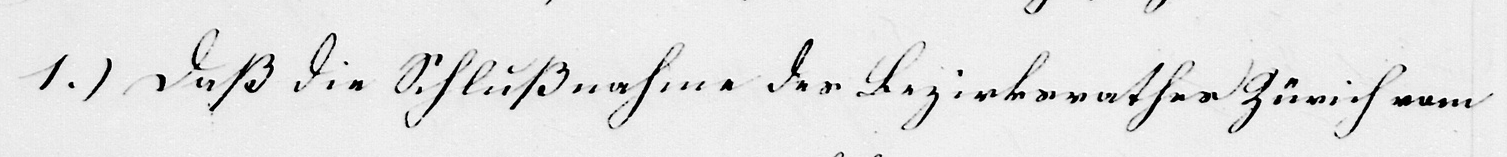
1.) Daß die Schlußnahme des Bezirksrathes Zürich vom
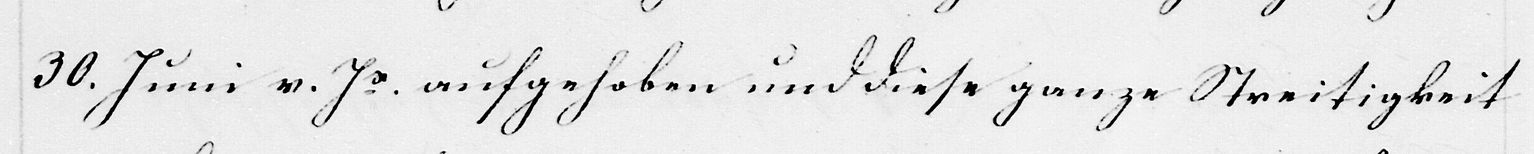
30. Juni v. Js. aufgehoben und diese ganze Streitigkeit
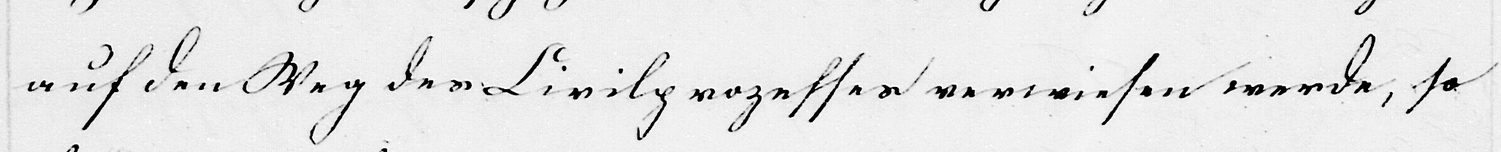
auf den Weg des Civilprozesses verwiesen werde, so
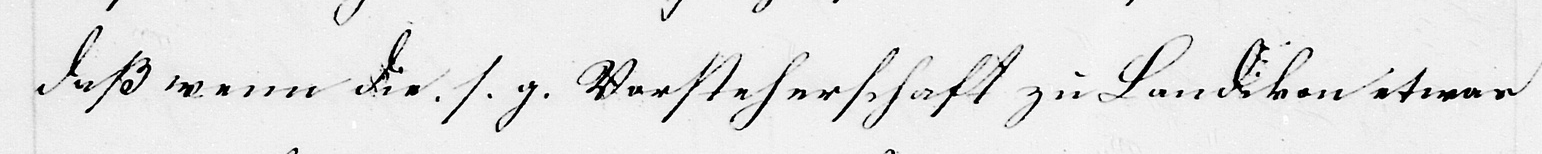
daß wenn die. s. g. Vorsteherschaft zu Landikon etwas
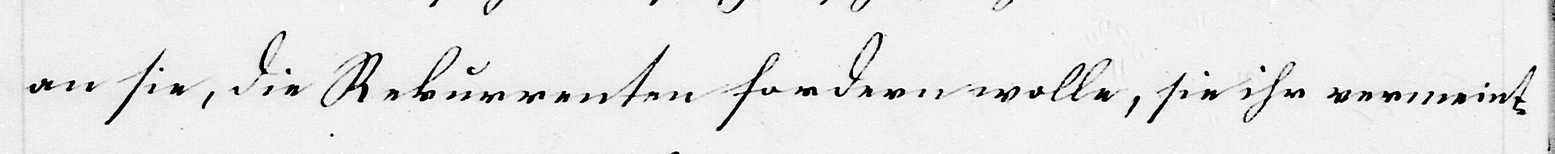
an sie, die Rekurrenten fordern wolle, sie ihr vermeint¬
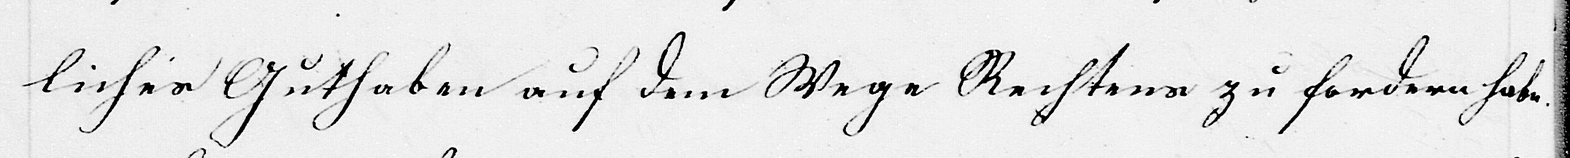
liches Guthaben auf dem Wege Rechtens zu fordern habe.
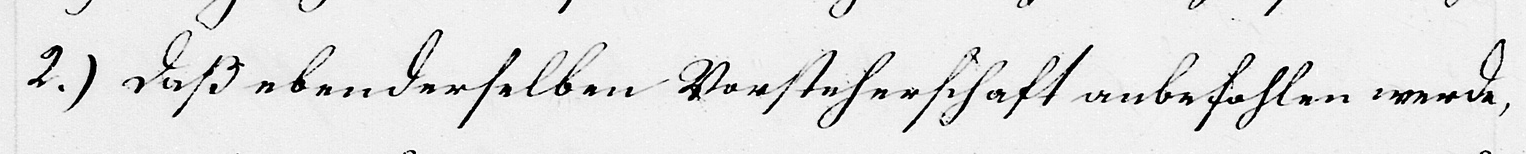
2.) Daß ebenderselben Vorsteherschaft anbefohlen werde,
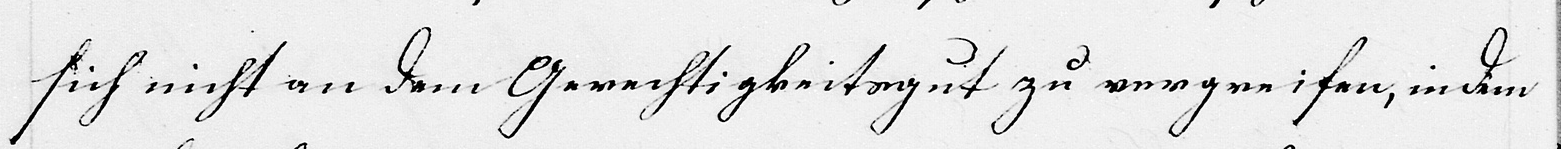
sich nicht an dem Gerechtigkeitsgut zu vergreifen, in dem
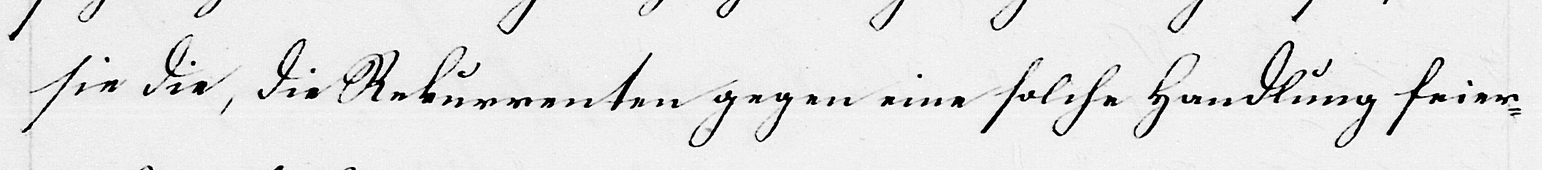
sie die, die Rekurrenten gegen eine solche Handlung feier¬
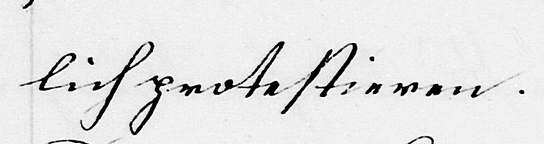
lich protestieren
